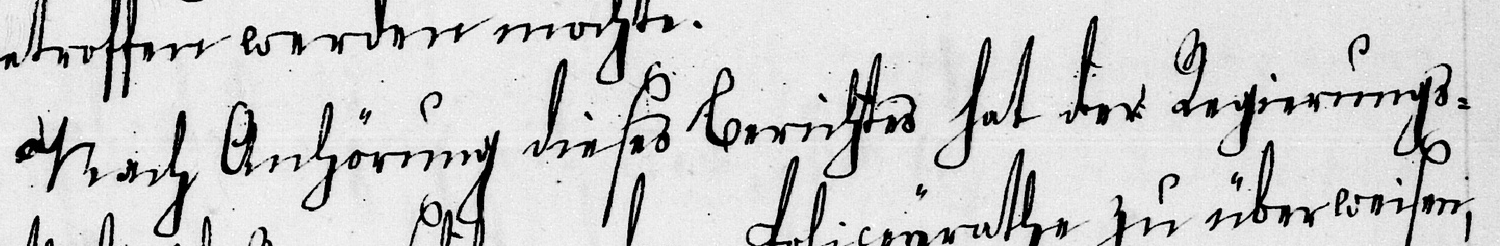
Nach Anhörung dieses Berichtes hat der Regierungs¬
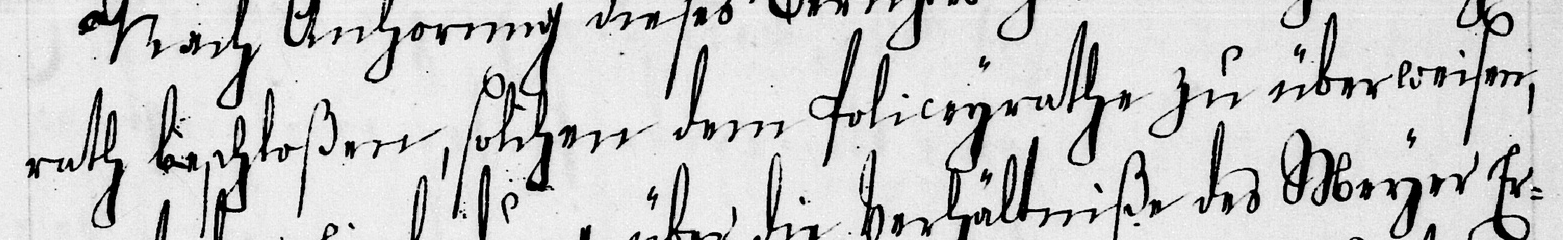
rath beschloßen, solchen dem Policeyrathe zu überweisen,
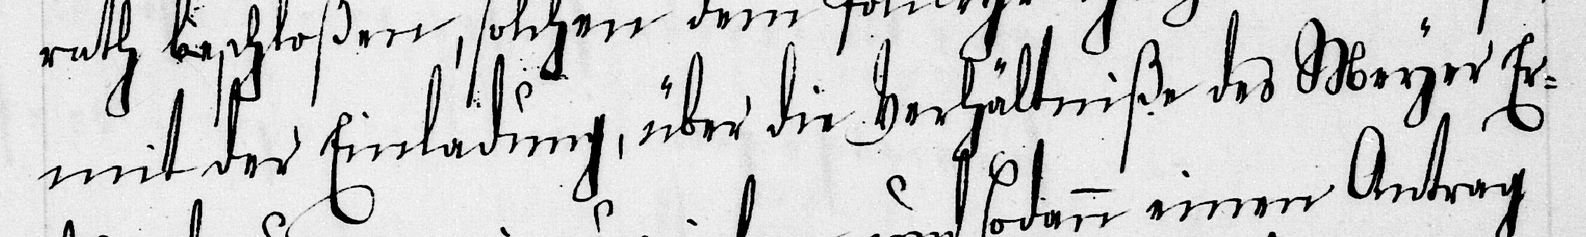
mit der Einladung, über die Verhältniße des Meyer Er¬
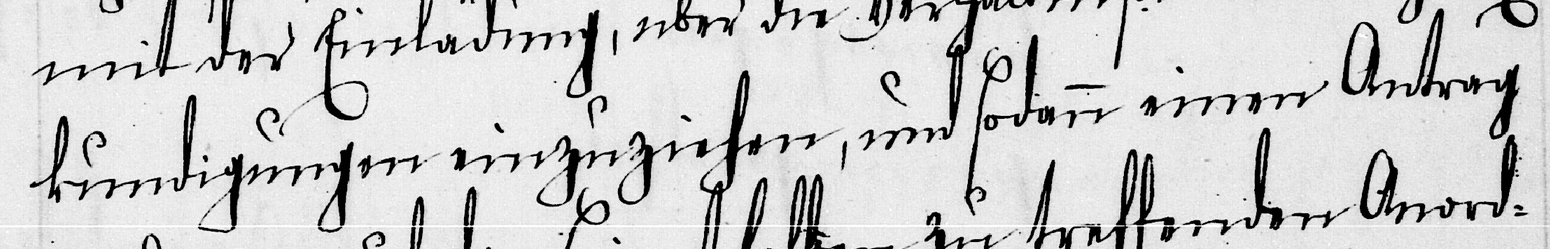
kundigungen einzuziehen, und sodann einen Antrag
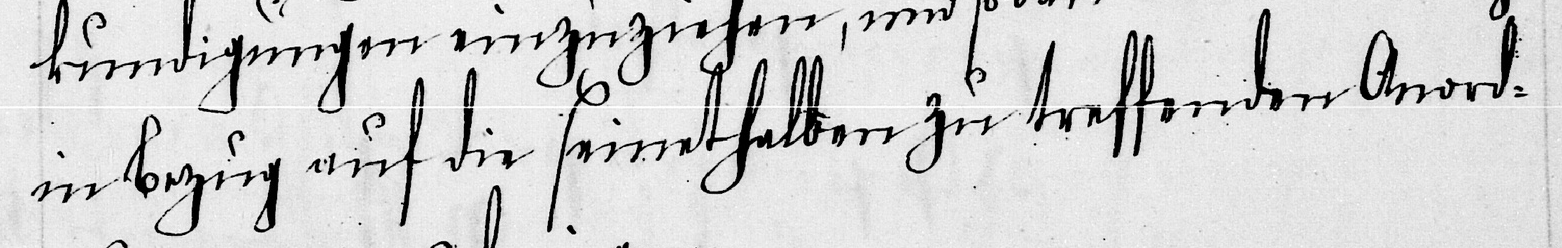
in Bezug auf die seinethalben zu treffenden Anord¬
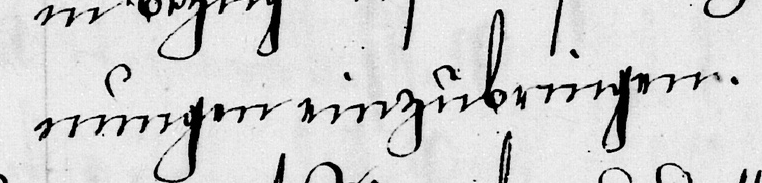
nungen einzubringen.
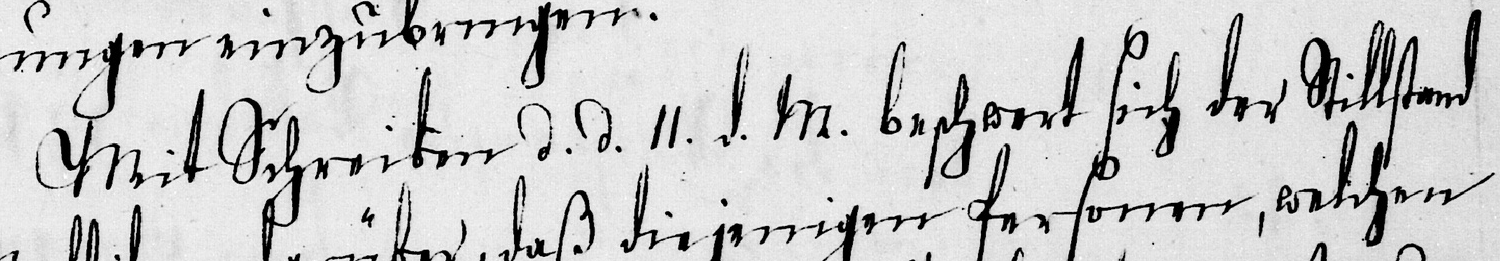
Mit Schreiben d. d. 11. d. M. beschwert sich der
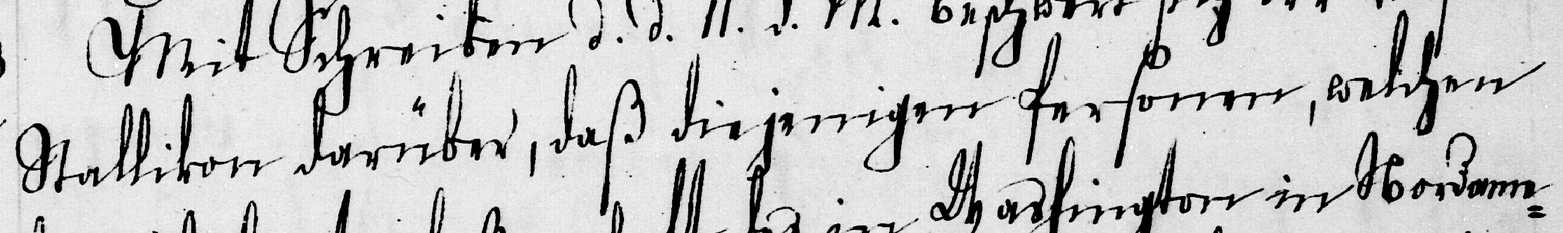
Stallikon darüber, daß diejenigen Personen, welchen
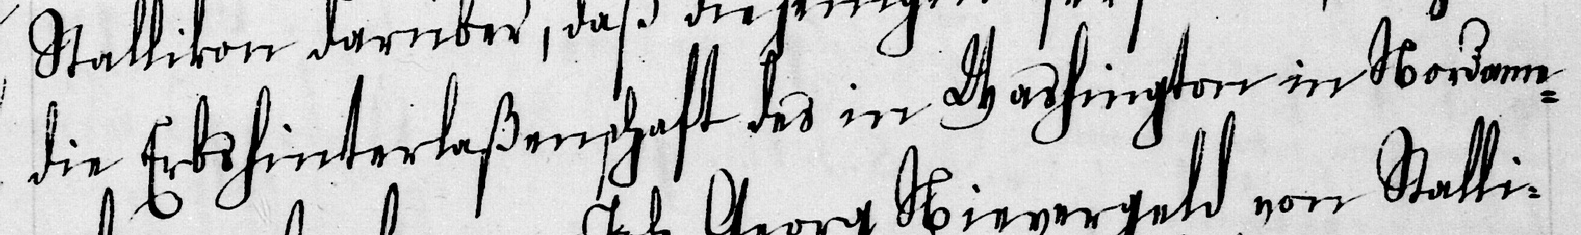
die Erbshinterlaßenschaft des in Washington in Nordame¬
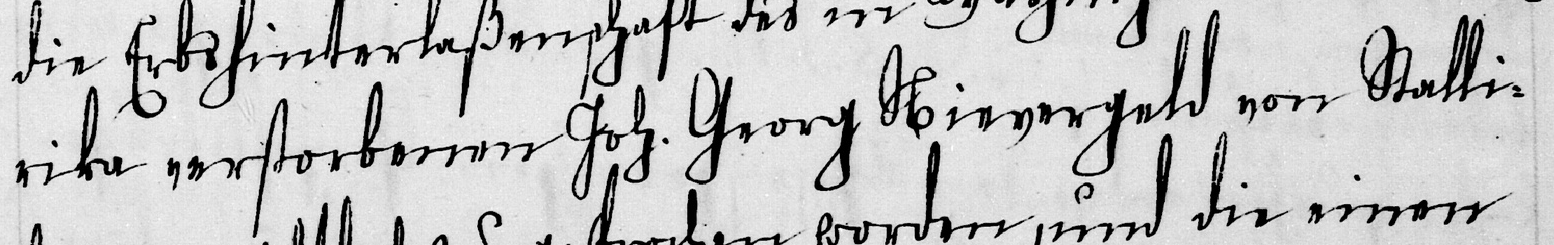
rika verstorbenen Joh. Georg Nievergeld von Stalli¬
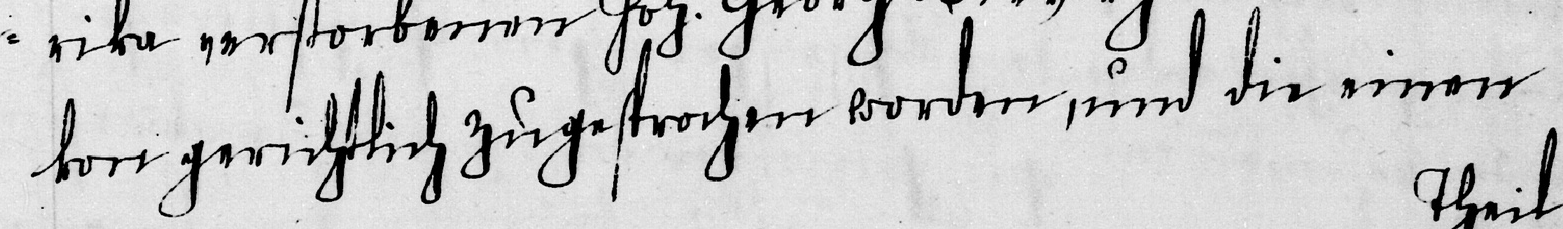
kon gerichtlich zugesprochen worden, und die einen
